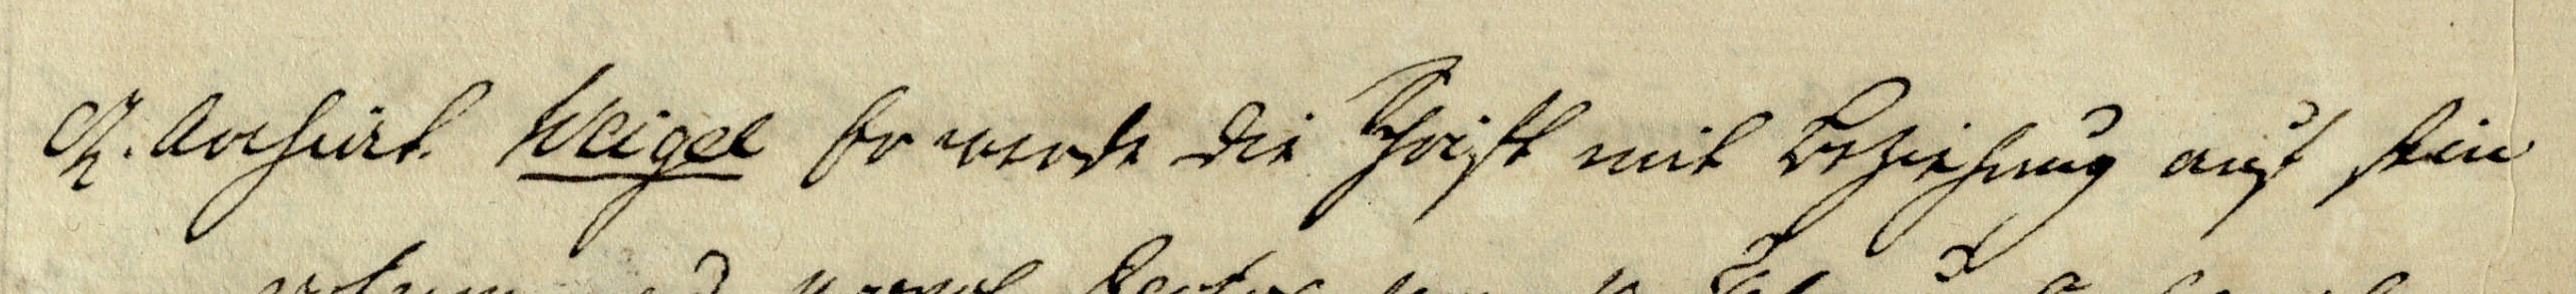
dh. Archiat Weigel Er werde die Schrift mit Beziehung auf sein
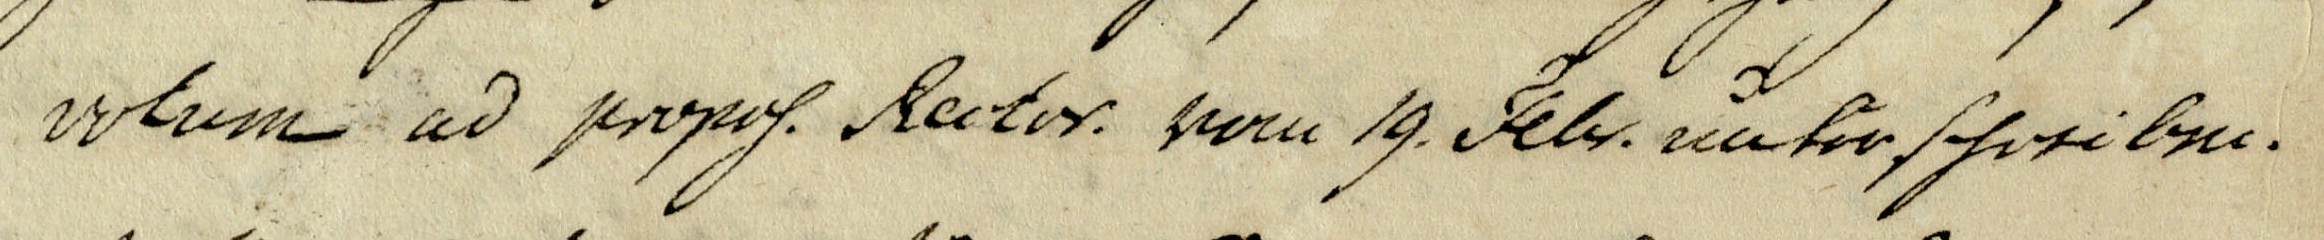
votum ad propos. Rector. vom 19. Febr. unterschreiben.
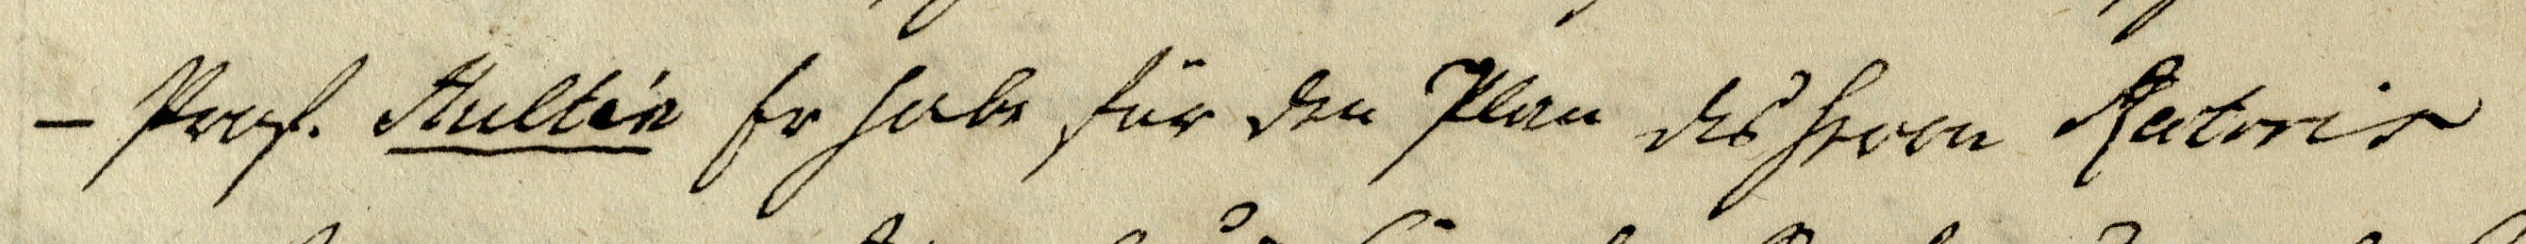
Prof. Hultén Er habe für den Plan des Herrn Rectoris
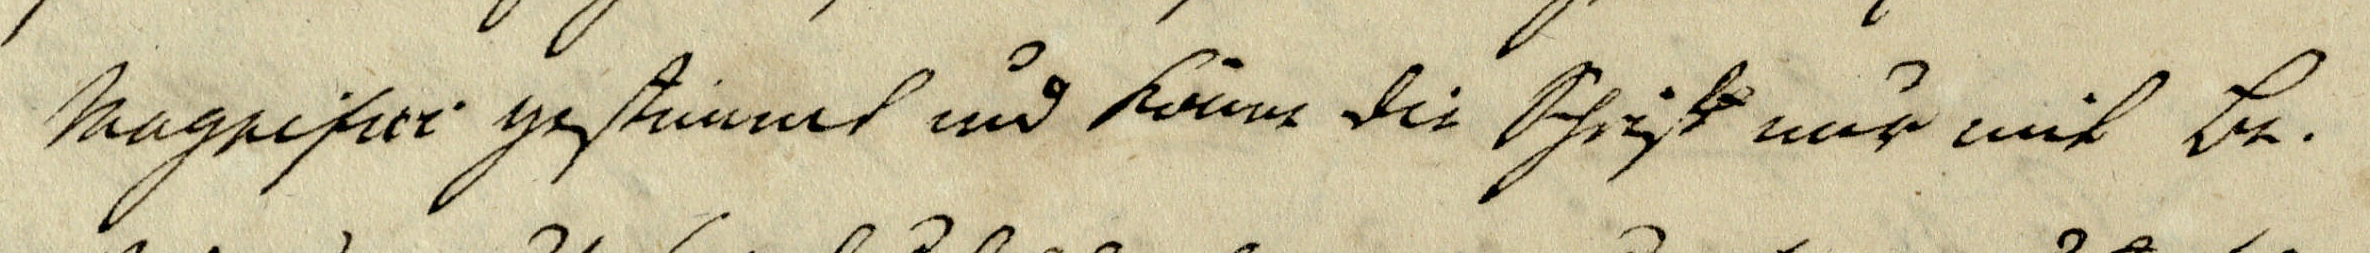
Magnifici gestimmt und könne die Schrift nur mit Be¬
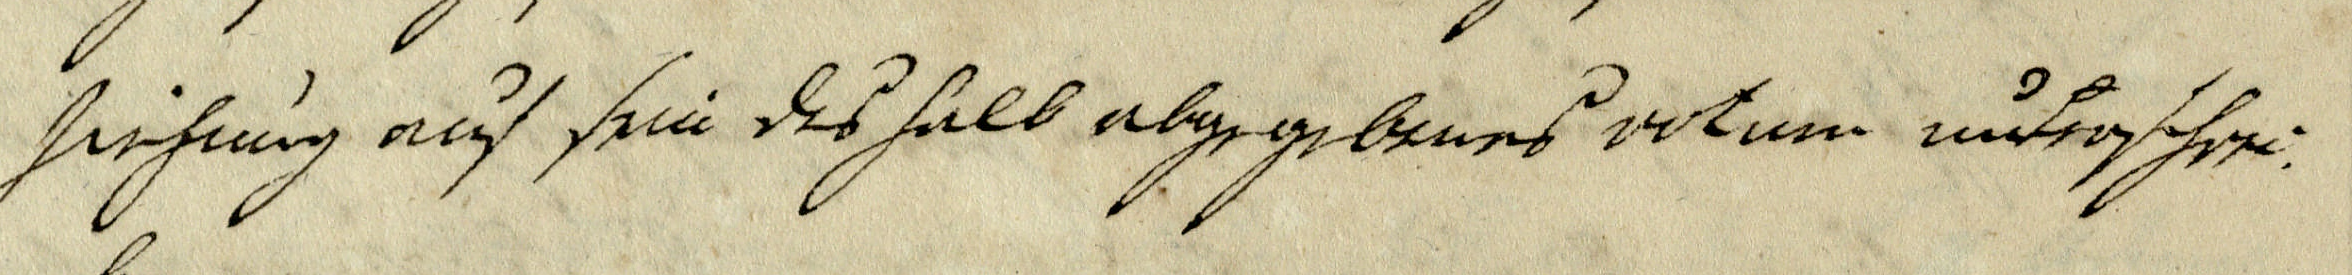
ziehung auf sein deshalb abgegebenes votum unterschrei¬
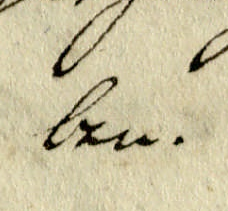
ben.
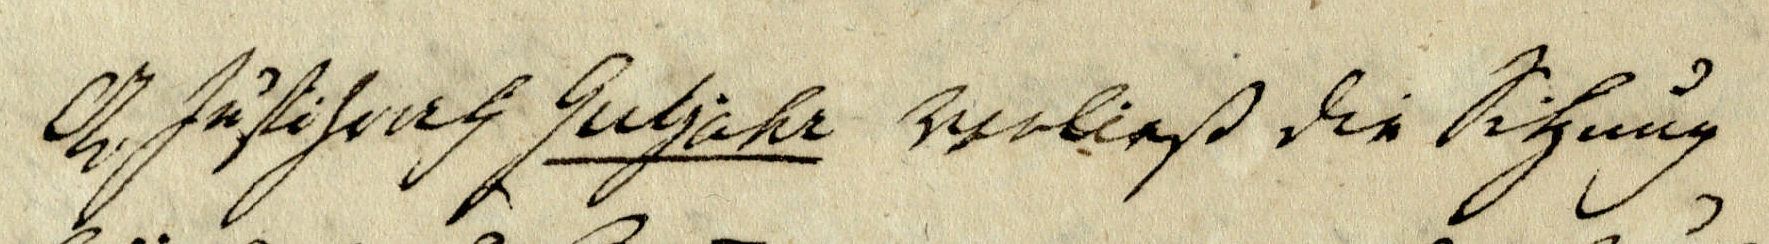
dh Justizrath Gutjahr verließ die Sitzung
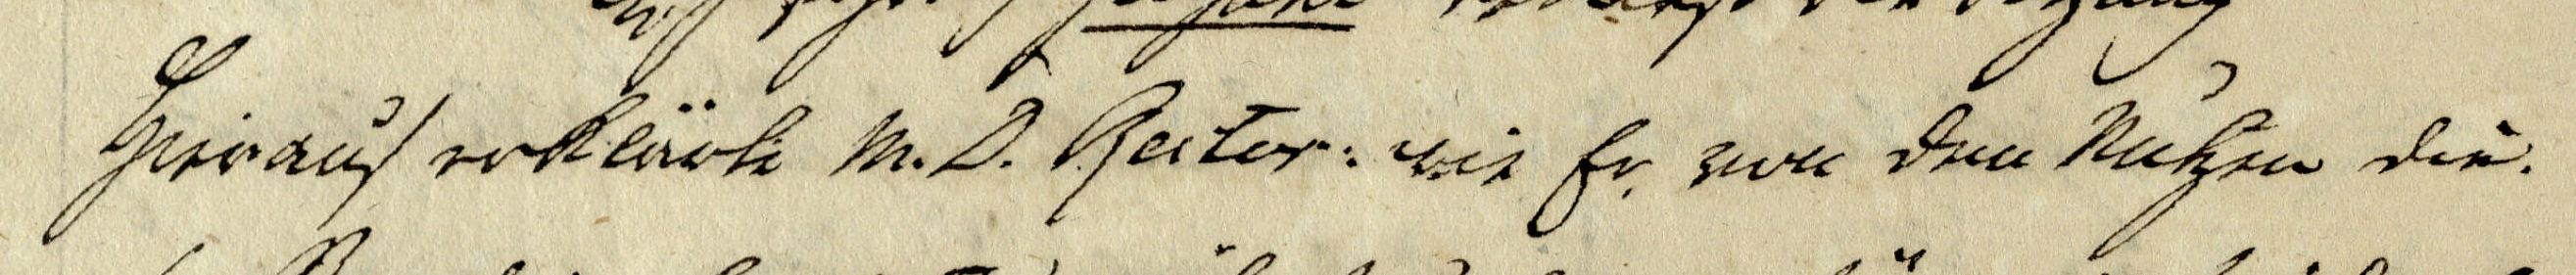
Hierauf erklärte M. D. Rector: wie Er von dem Nutzen die¬
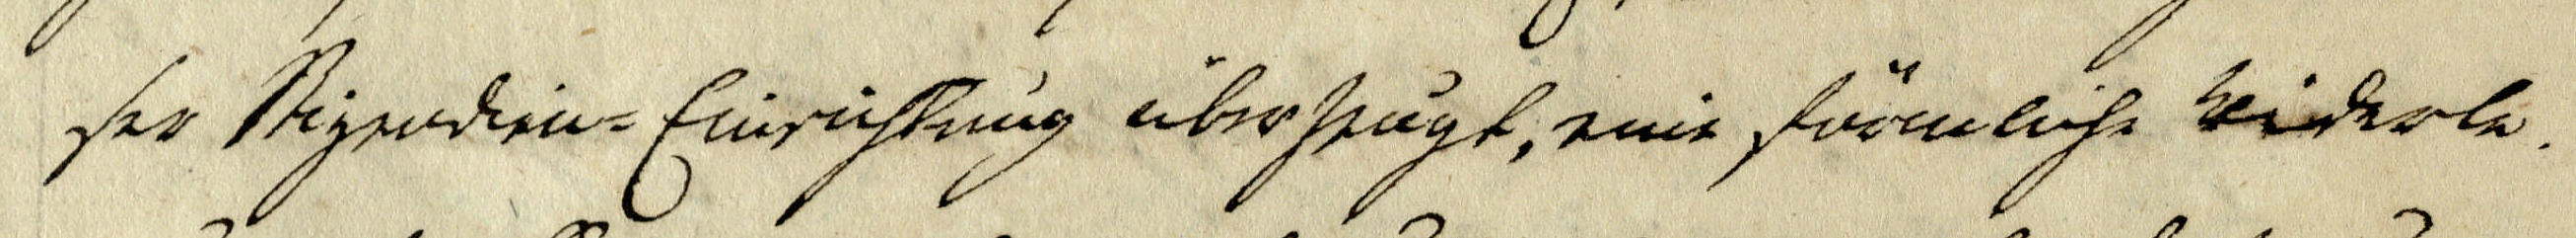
ser Stipendien Einrichtung überzeugt, eine förmliche Widerle¬
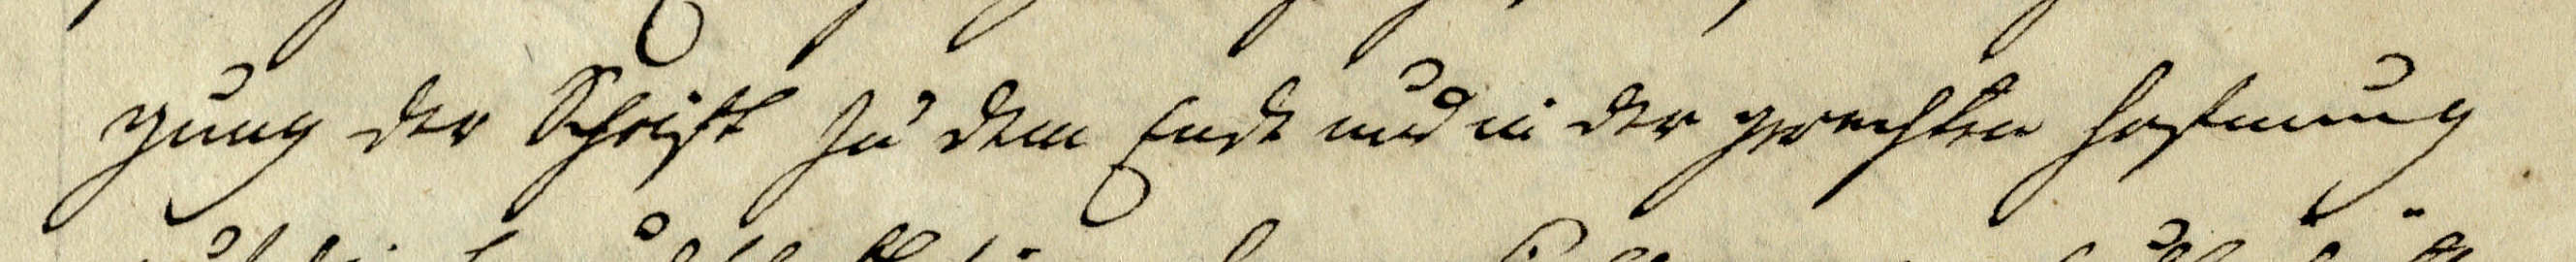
gung der Schrift zu dem Ende und in der gerechten Hofnung
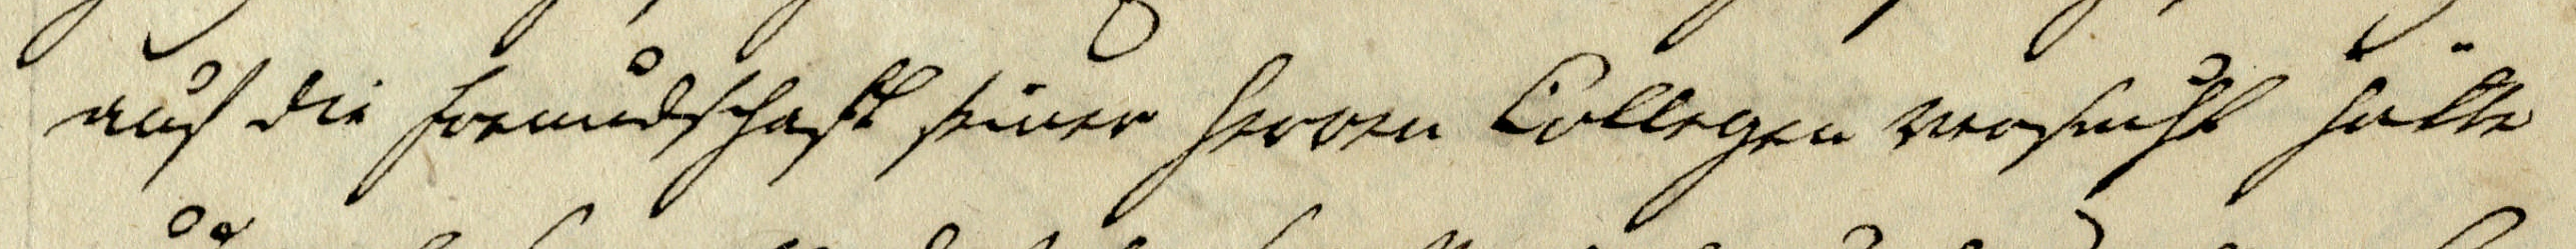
auf die Freundschaft seiner Herren Collegen versucht hätte
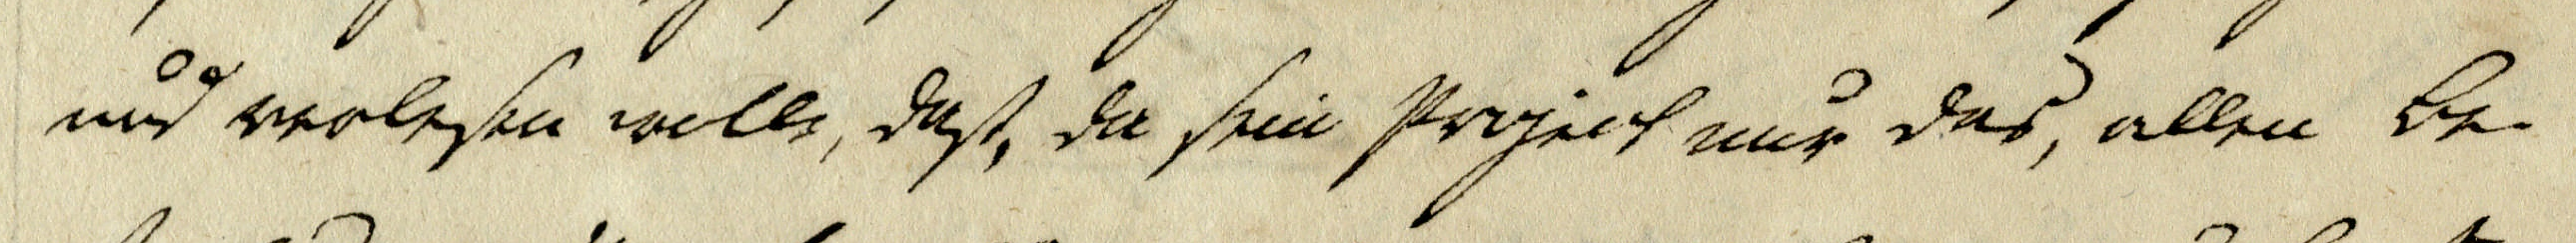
und verlesen wolle, daß, da sein Project nur das, allen Be¬
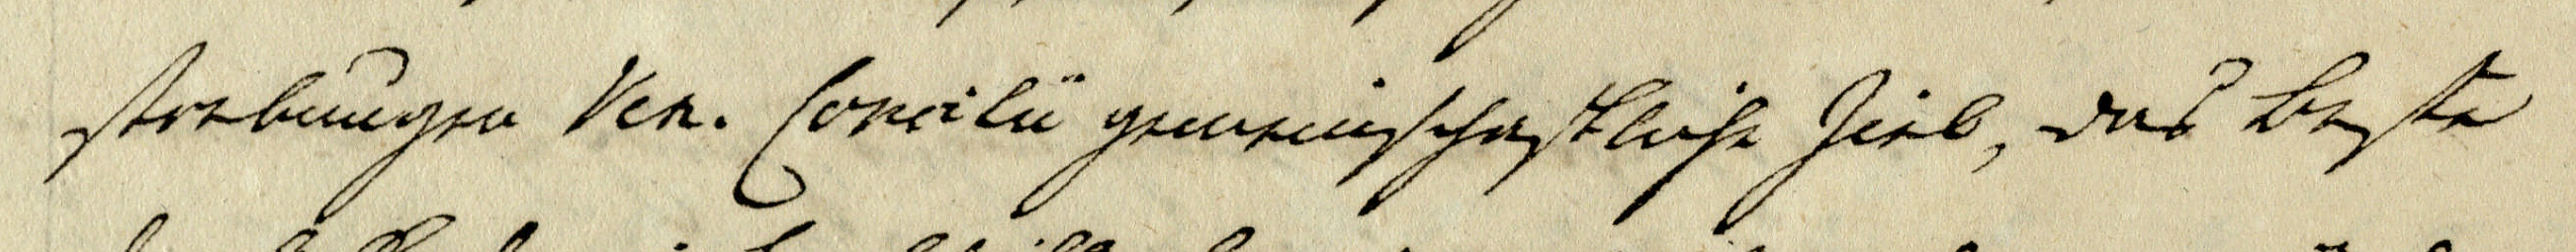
strebungen Ven. Concilii gemeinschaftliche Ziel, das Beste
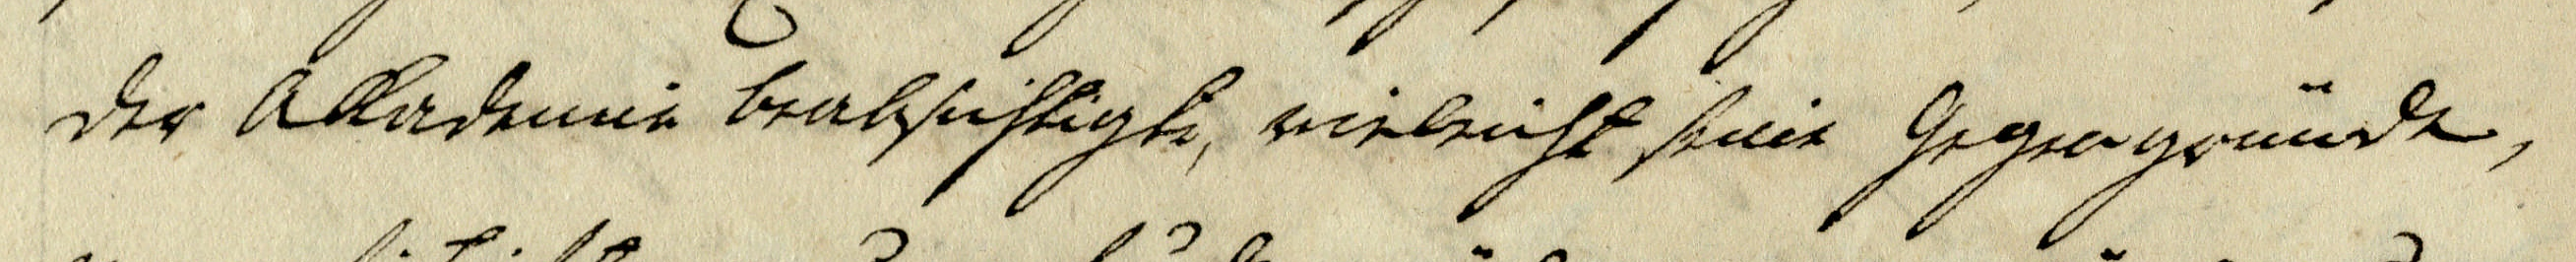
der Akademie beabsichtigte, vieleicht seine Gegengründe,
